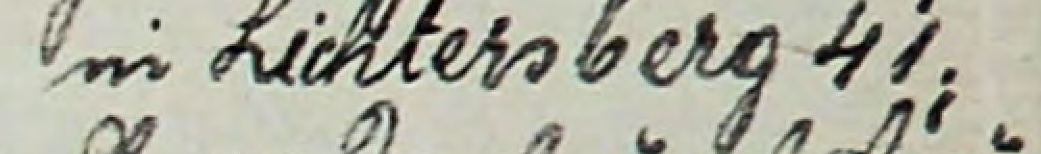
in Lichtersberg 41;
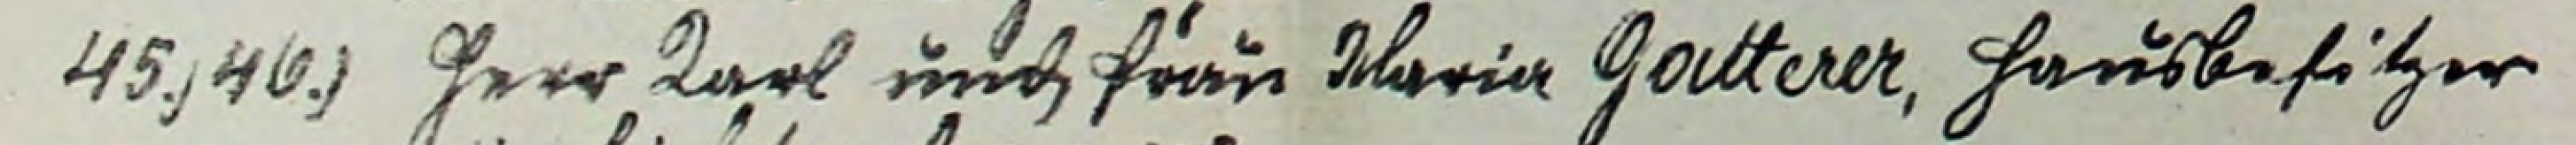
45.) 46.) Herr Karl und Frau Maria Gatterer, Hausbesitzer
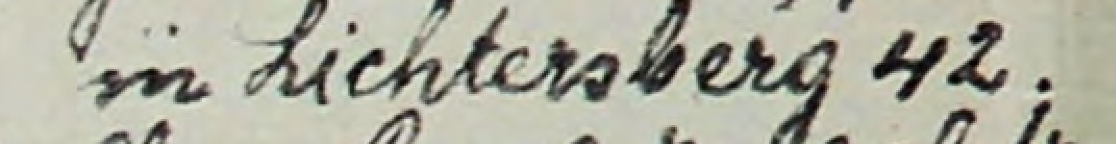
in Lichtersberg 42;
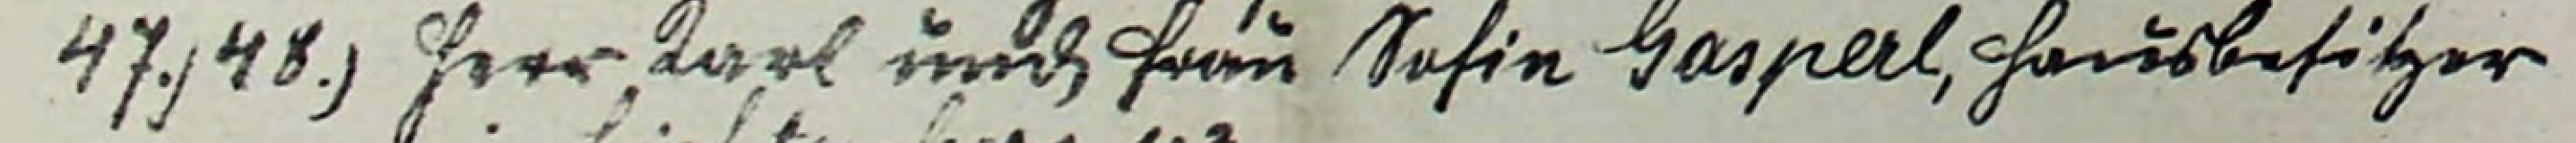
47.) 48.) Herr Karl und Frau Sofie Gasperl, Hausbesitzer
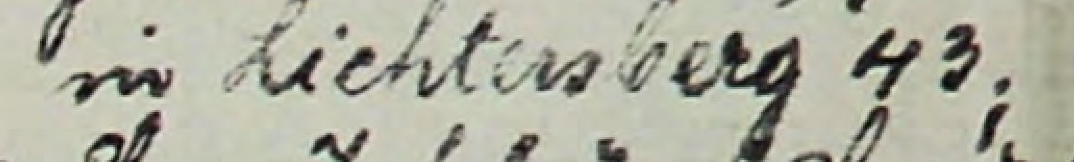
in Lichtersberg 43;
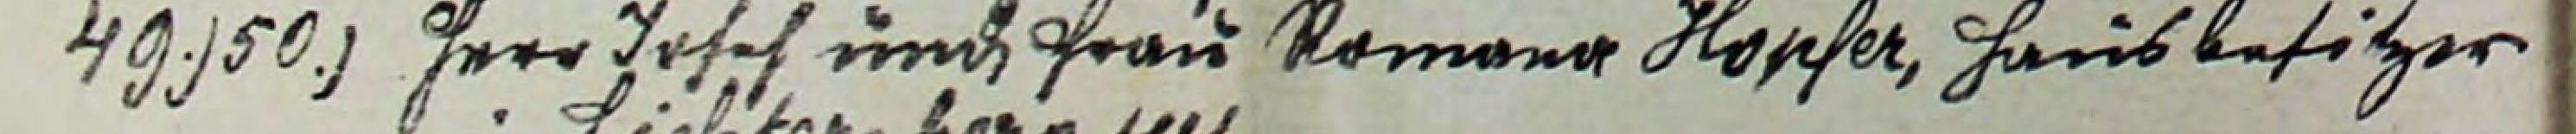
49.) 50.) Herr Josef und Frau Romana Hopfer, Hausbesitzer
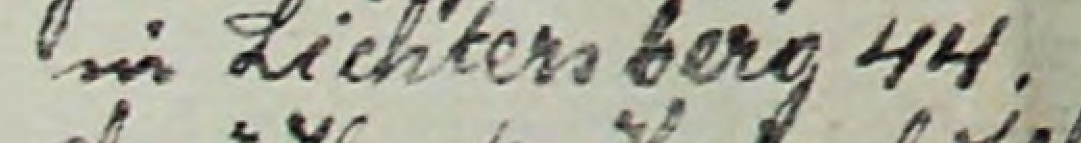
in Lichtersberg 44;
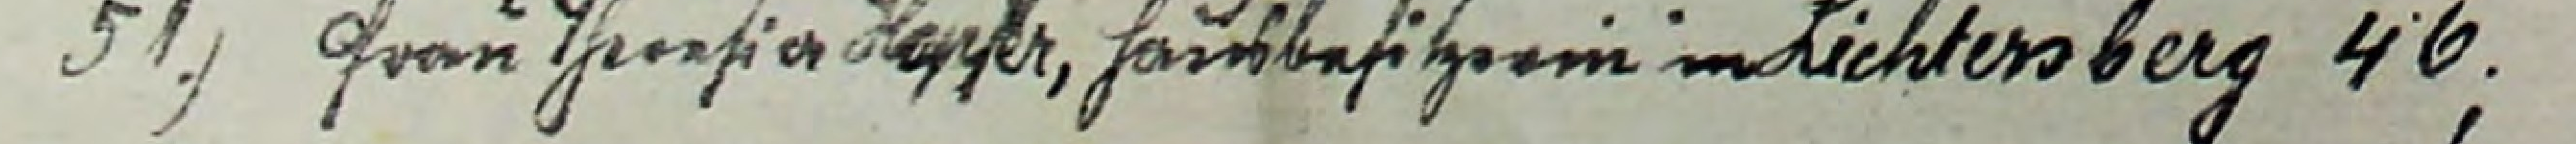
51.) Frau Theresia Hopfer, Hausbesitzerin in Lichtersberg 46;
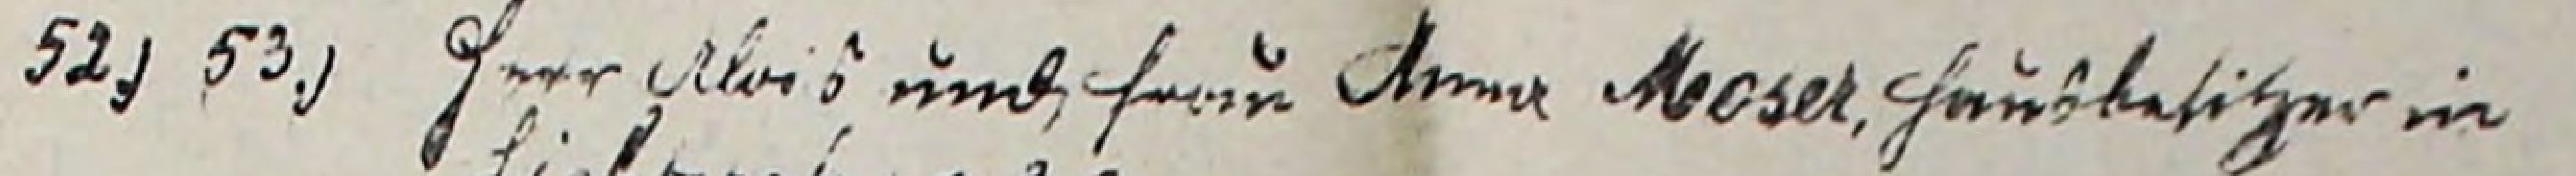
52.) 53.) Herr Alois und Frau Anna Moser, Hausbesitzer in
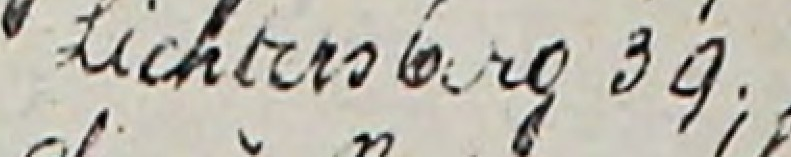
Lichtersberg 39;
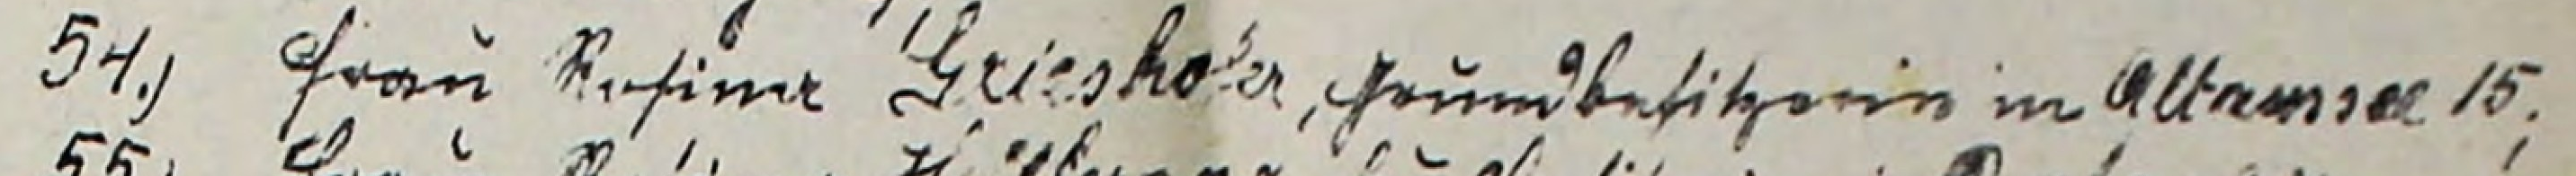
54.) Frau Rosina Grieshofer, Grundbesitzerin in Altaussee 15;
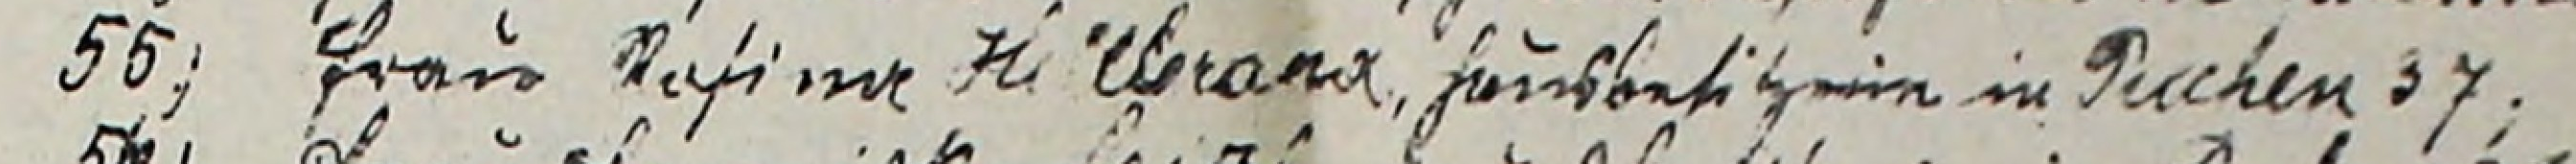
55.) Frau Rosina Hillbrand, Hausbesitzerin in Puchen 37;
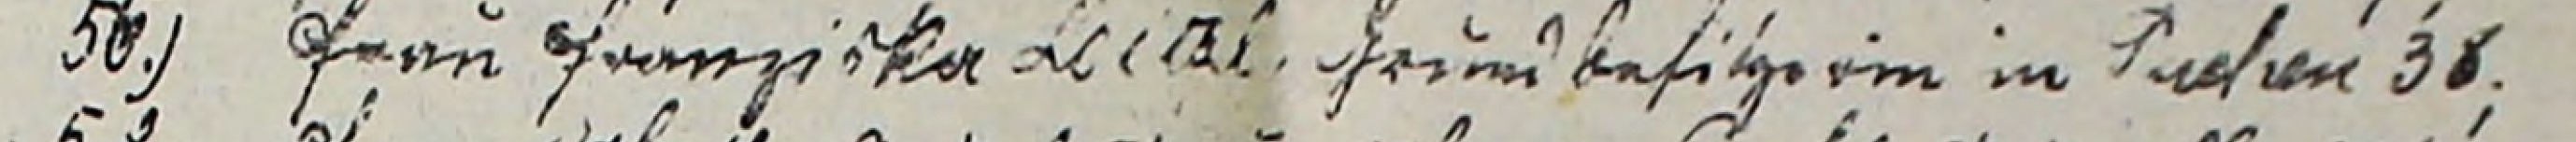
56.) Frau Franziska Loitzl, Grundbesitzerin in Puchen 38;
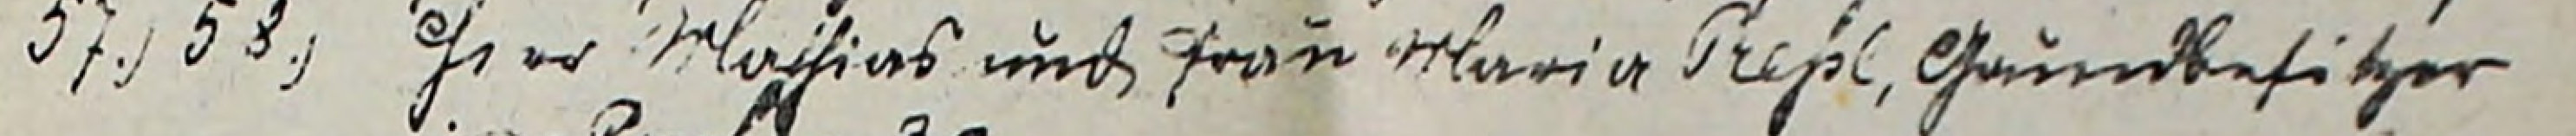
57.) 58.) Herr Mathias und Frau Maria Pressl, Grundbesitzer
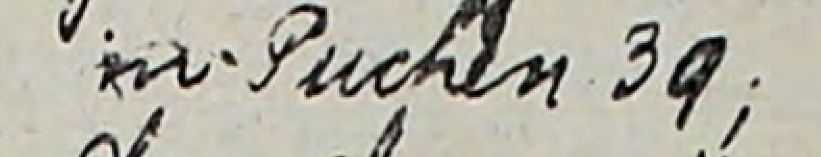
in Puchen 39;
